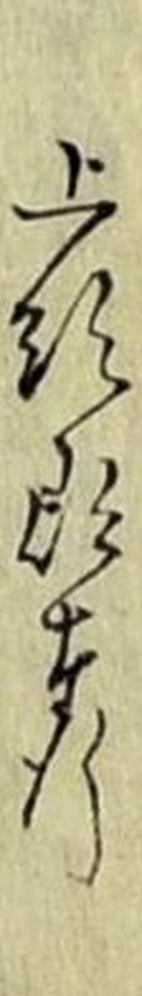上領郡奉行
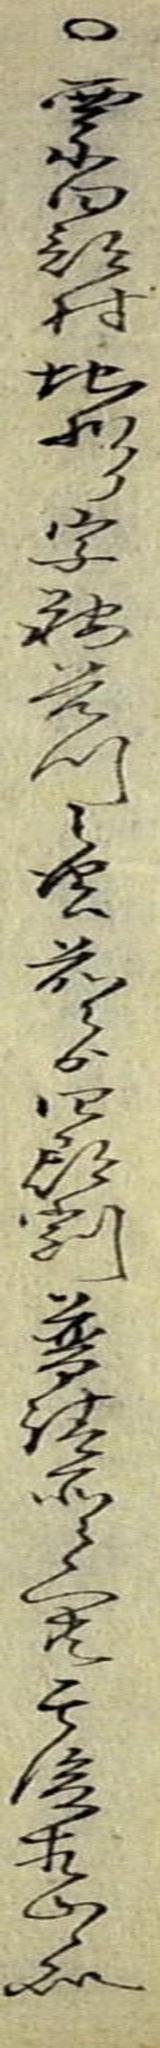○栗田部村地掛り字鞍谷川之儀は前々ゟ四郡割普請所に候へ共其後相止候処
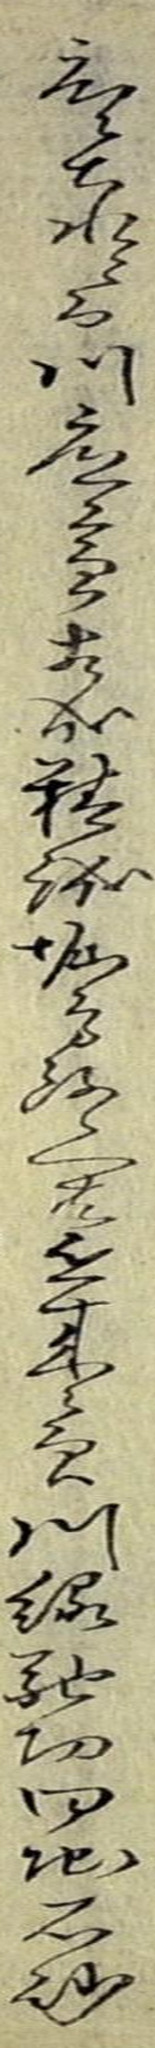度々出水に而川底高ク相成精誠掘方致候へ共近来に而は川縁弛切田地石砂
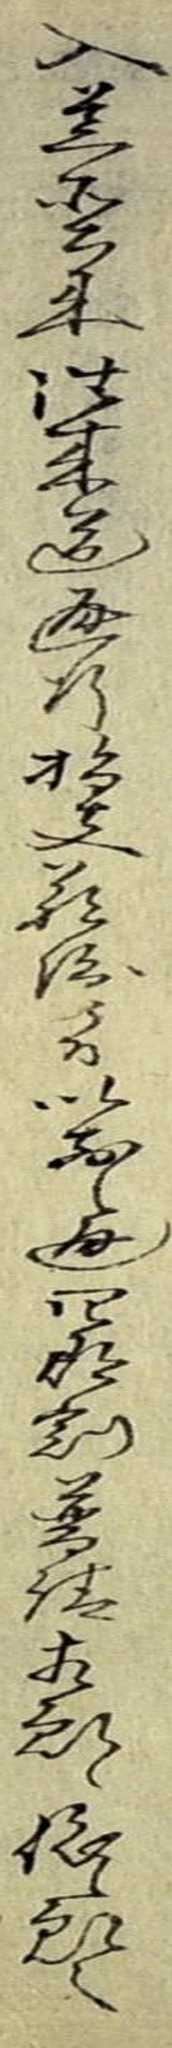入荒所出木往来道通行指支難儀に付以前之通四郡割普請相願候依之願之
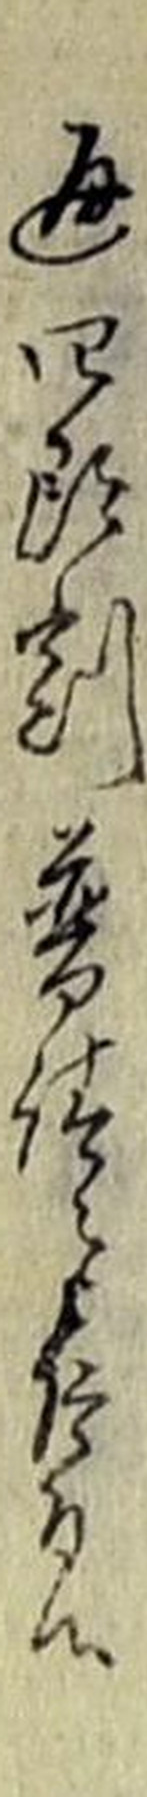通四郡割普請被仰付候
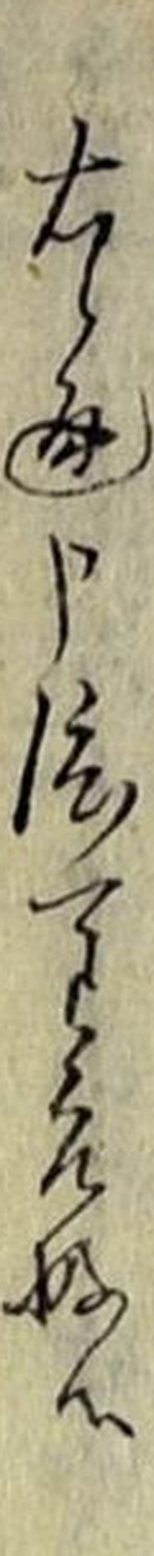右之通申渡可被取扱候
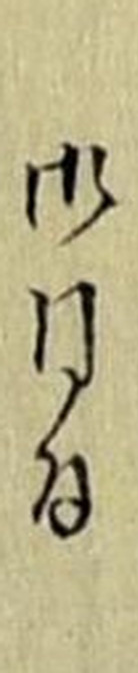御目付
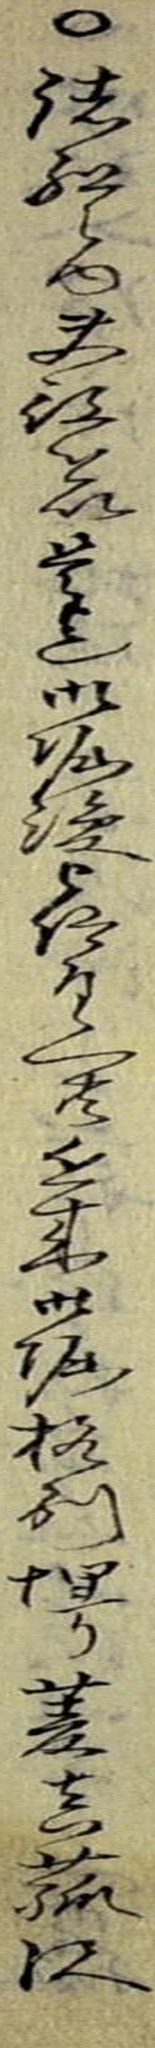○諸組之内夫役を以是迄御堀浚被仰付候へ共近来御堀格別埋り菱真菰沢
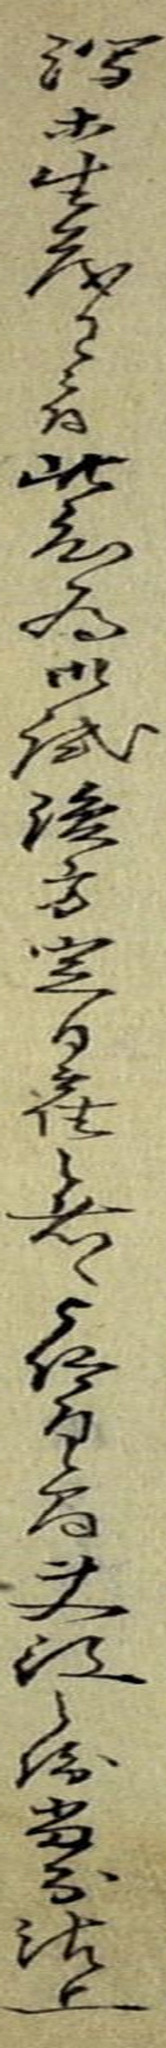泻等生茂り候に付此度為御試浚方定日雇之者へ被仰付候間夫役之儀当分銀上
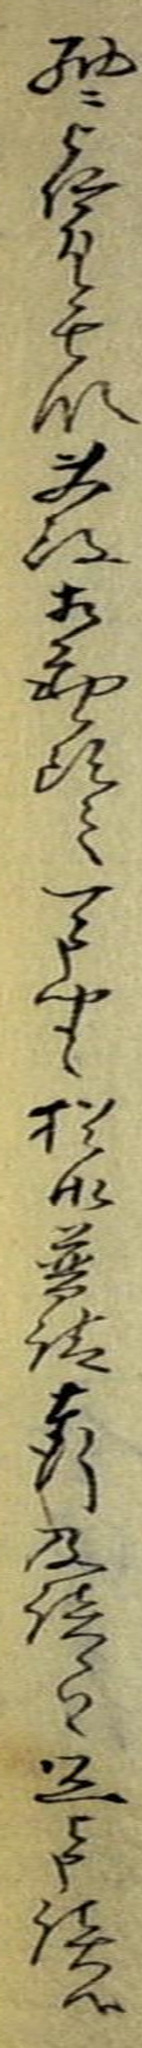納に被仰付候其段夫役相勤候頭々可申聞候猶御普請奉行及談候はヽ宜被申談候
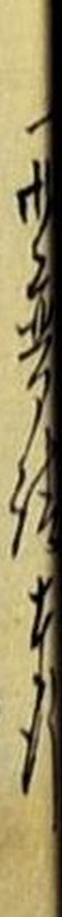御普請奉行
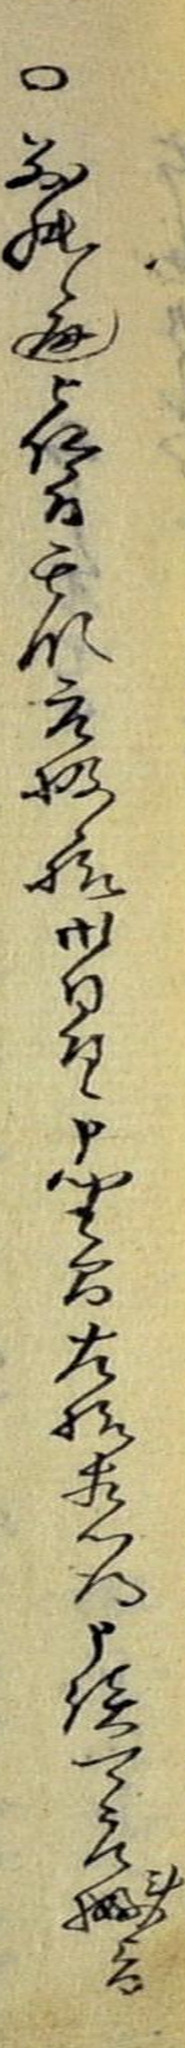○別紙之通被仰付其段取扱候様御目付へ申聞候間左様相心得申談可被取扱旨
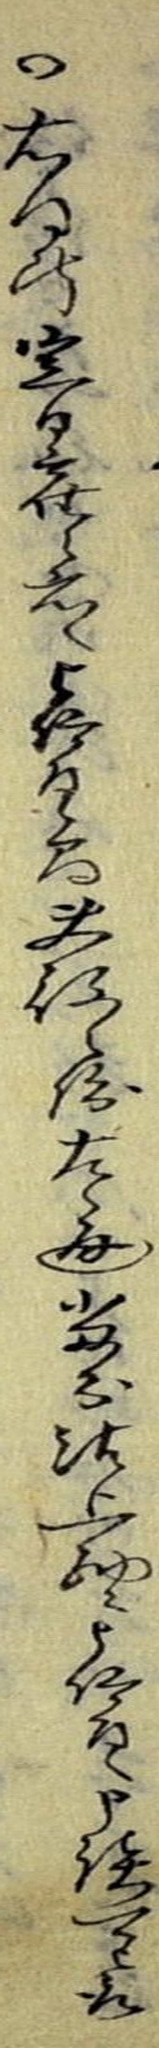○右同断定日雇之者へ被仰付候間夫役之儀左之通当分銀上納に被仰付候申段可被取
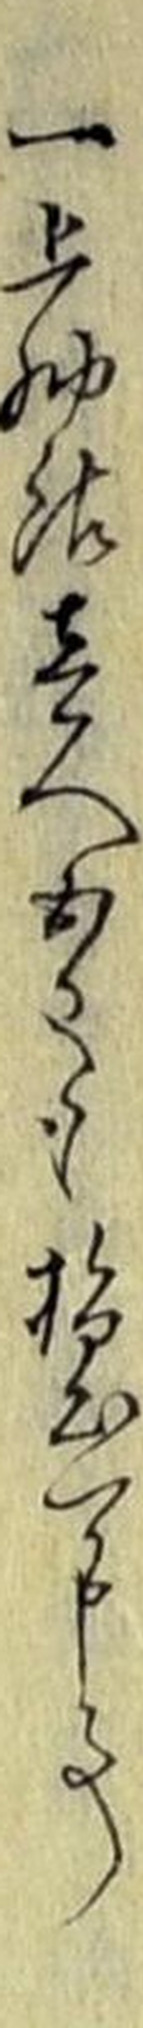一上納銀壱人五匁つヽ指出可申事
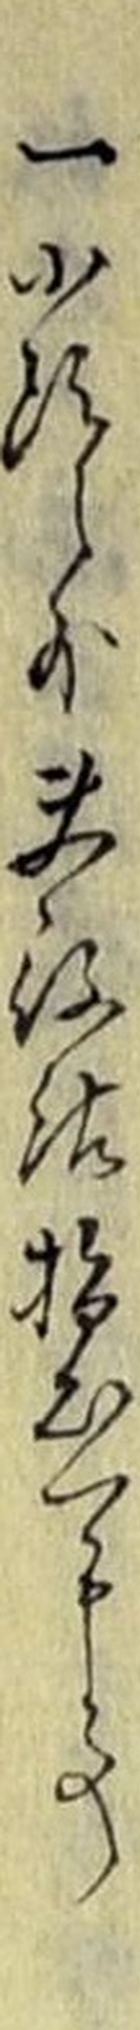一小頭之外夫役銀指出可申事
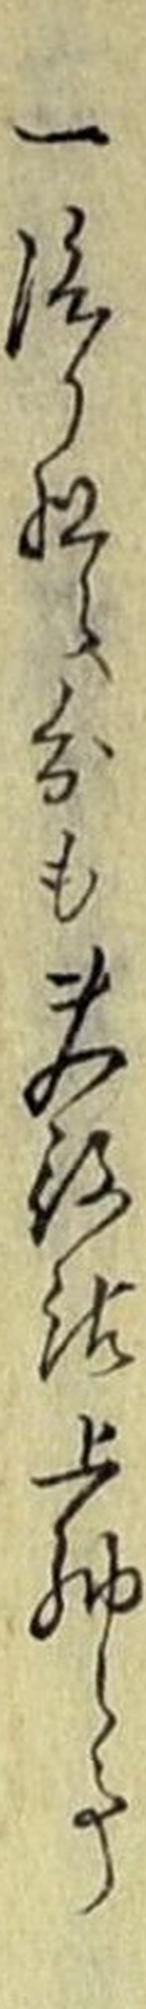一渡り組之分も夫役銀上納候事
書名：命令之部 六
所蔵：福井県文書館 Fukui Prefectural Archives
